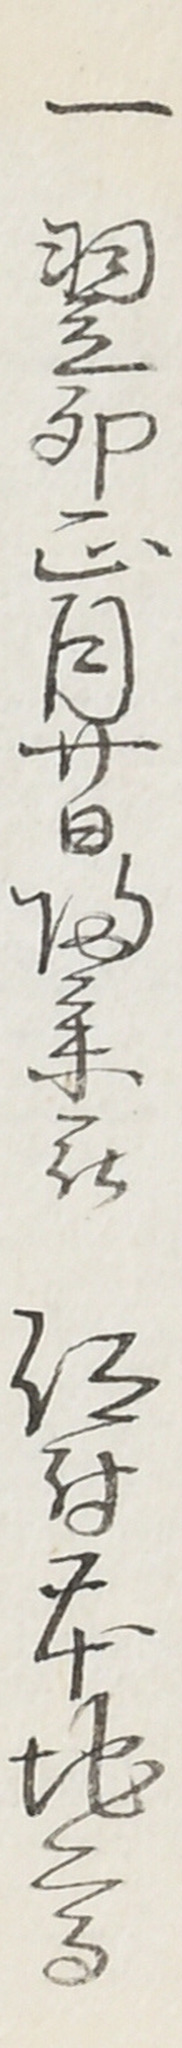一翌卯正月廿日帰参被仰付本地高
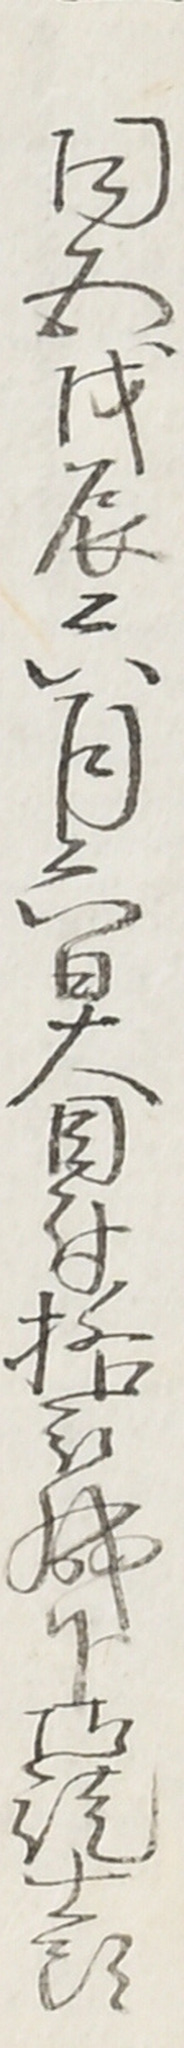一同五戊辰六月六日大目付格被成下御徒士頭
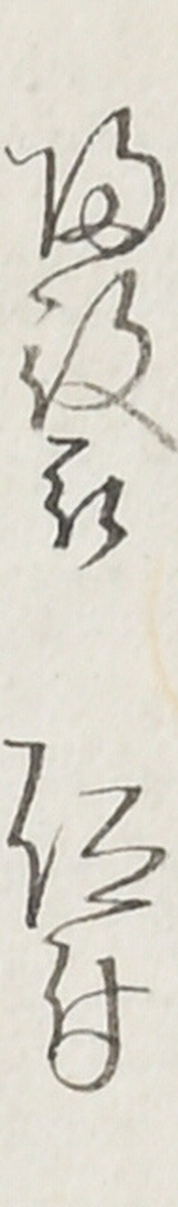帰役被仰付
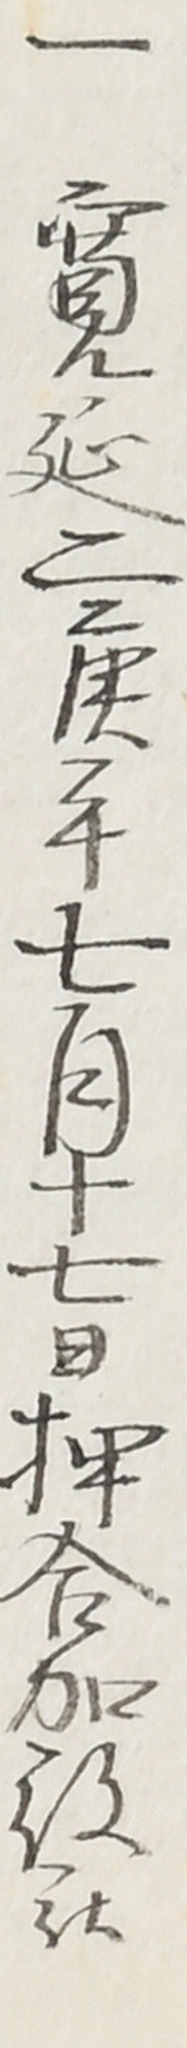一寛延二庚午七月十七日押合加役被
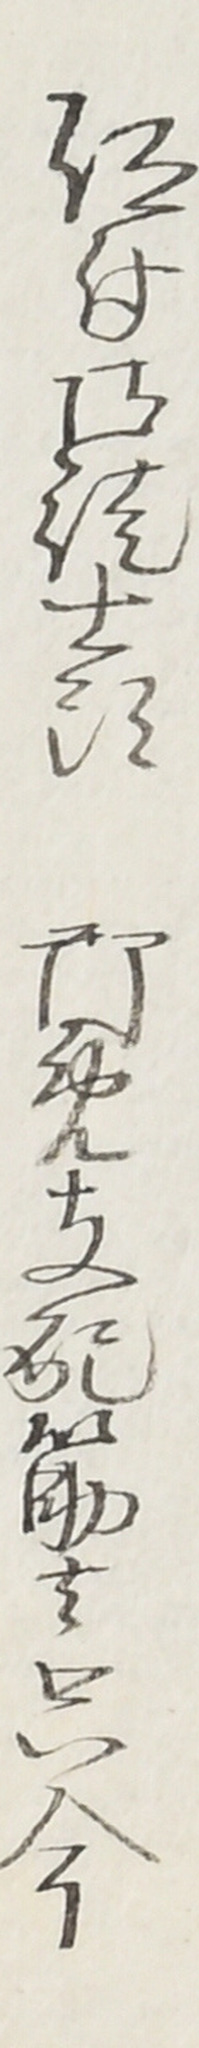仰付御徒士頭御免支配筋は只今
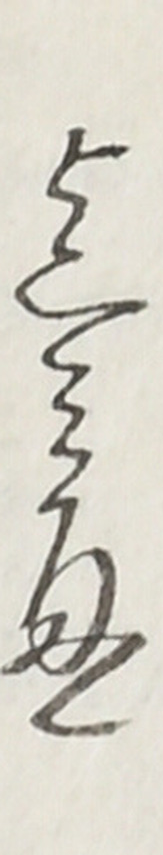迄之通
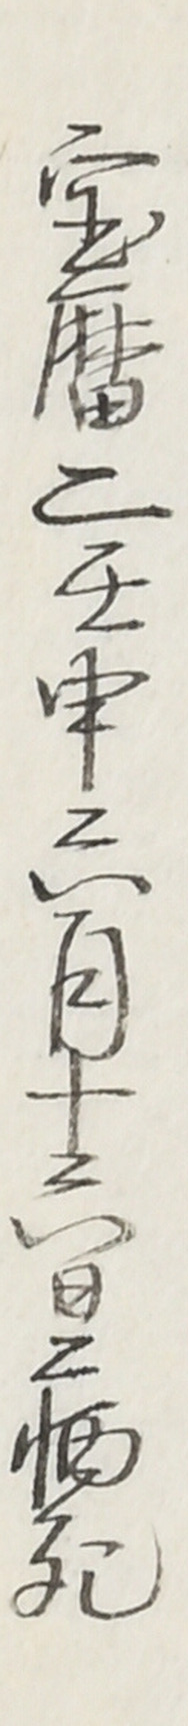一宝暦二壬申六月十六日病死

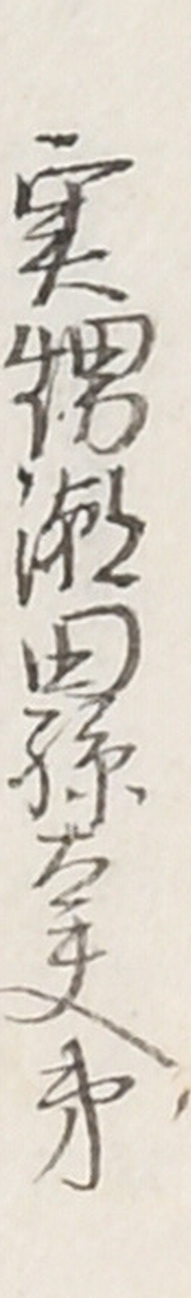実甥瀬田孫太夫弟
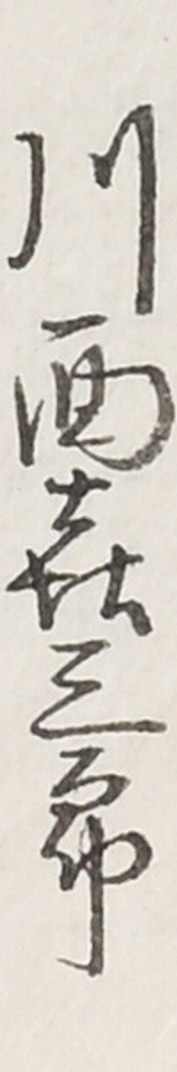川西喜三郎
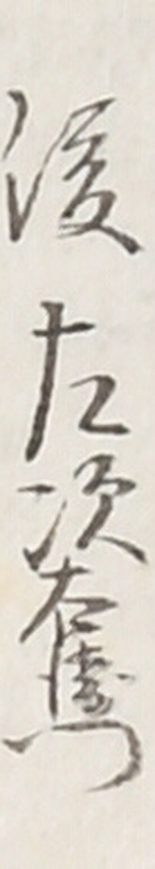後左次右衛門
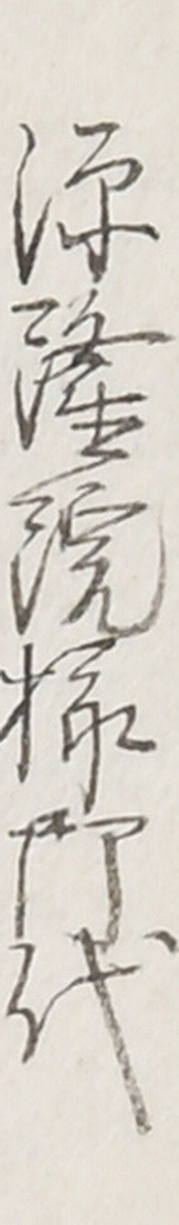源隆院様御代
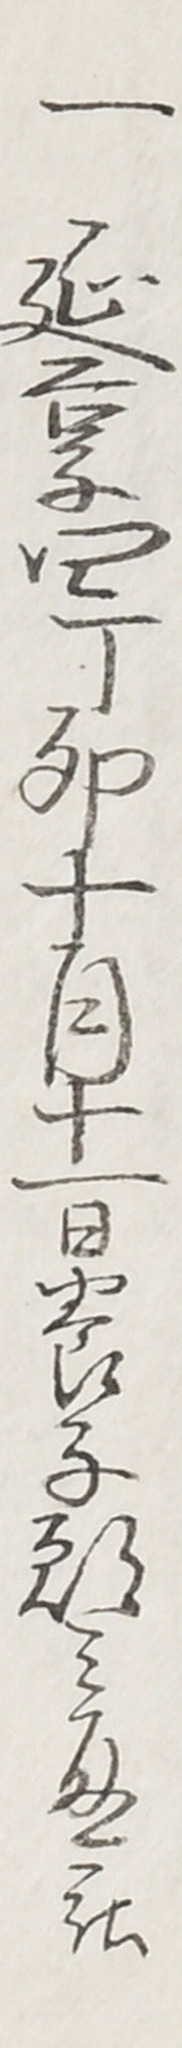一延享四丁卯十月十一日養子願之通被
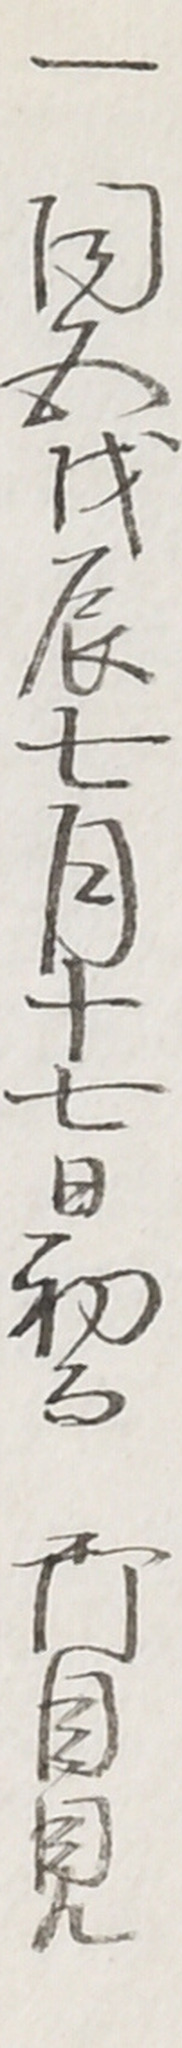一同五戊辰七月十七日初而御目見
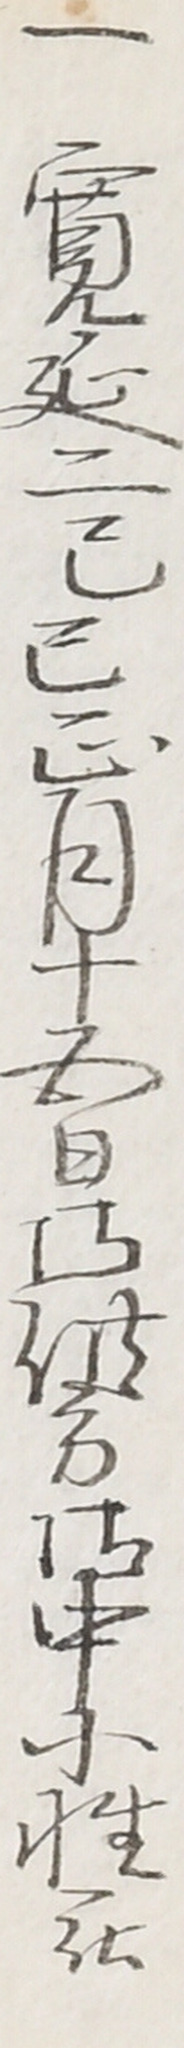一寛延二己巳正月十五日御供方御中小性被
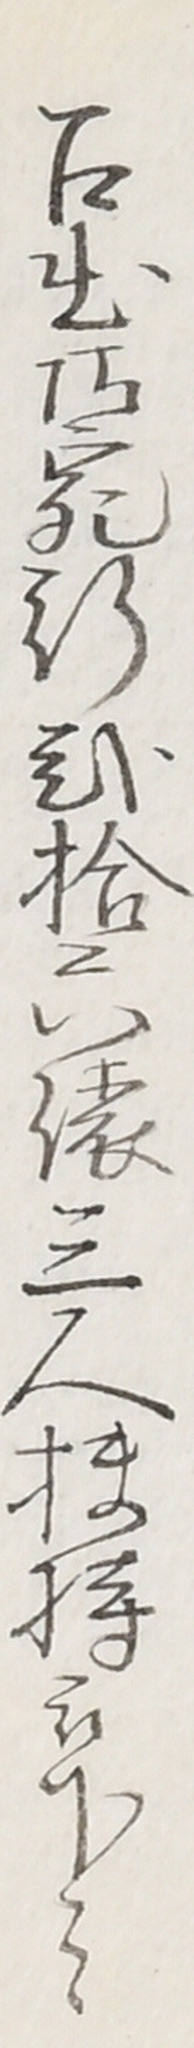召出御宛行弐拾六俵三人扶持被下之
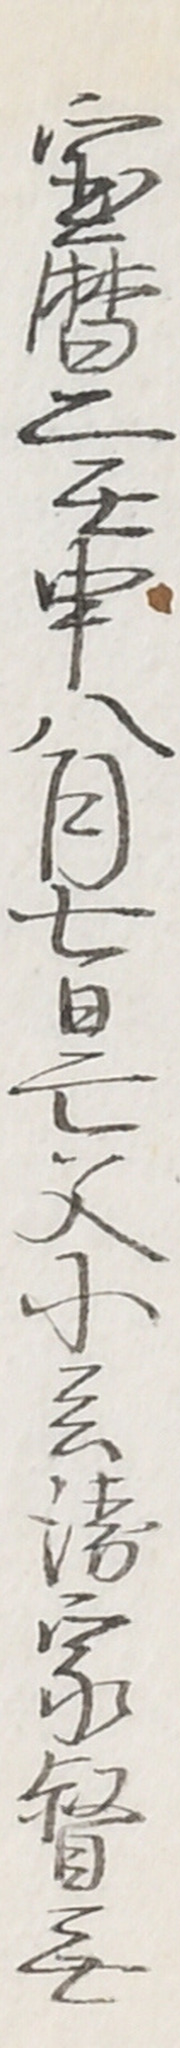一宝暦二壬申八月七日亡父小兵衛家督無
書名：給人諸士勤仕録（七）
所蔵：伊那市立高遠町図書館・合同会社AMANE
